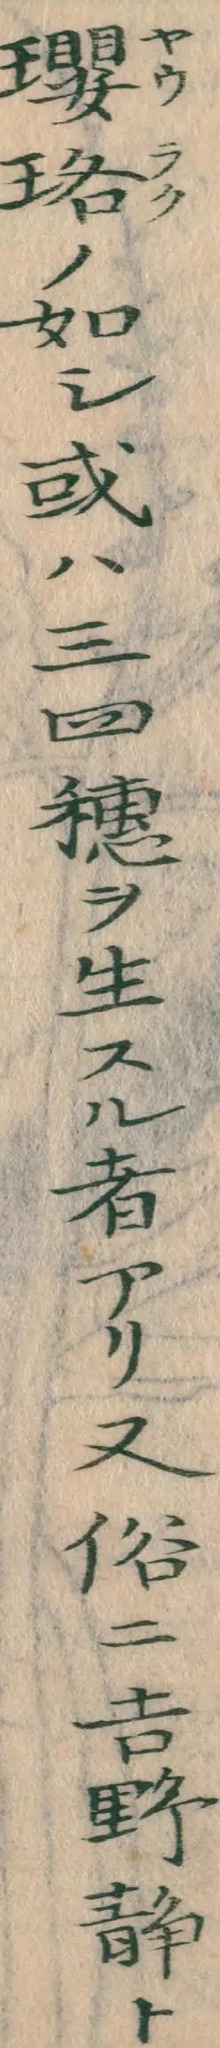瓔珞ノ如シ或ハ三四穂ヲ生スル者アリ又俗ニ吉野静ト
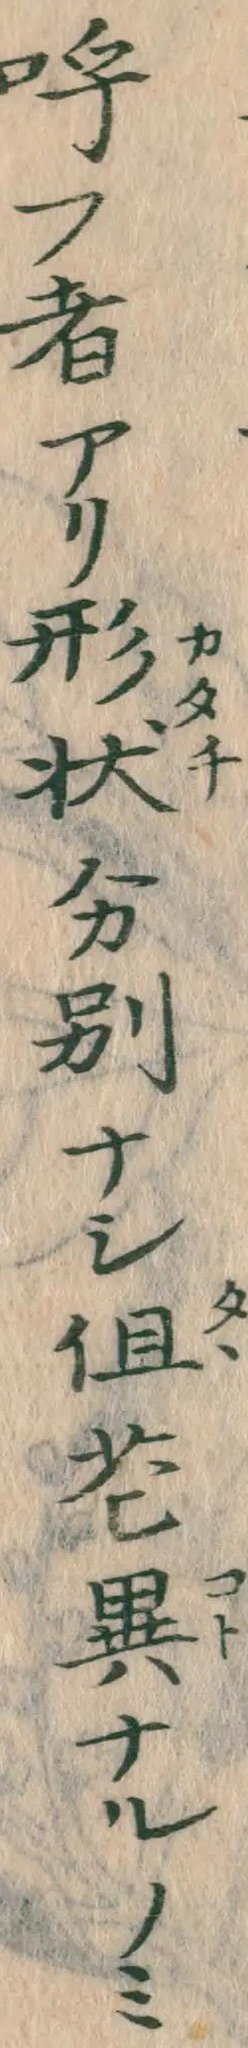呼フ者アリ形状分別ナシ但花異ナルノミ

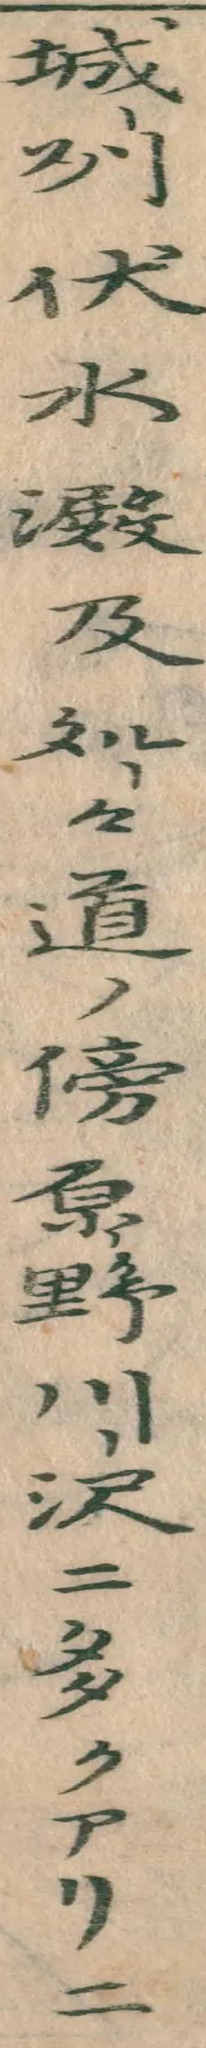城-州伏水澱及処-々道ノ傍原-野川-沢ニ多クアリ二
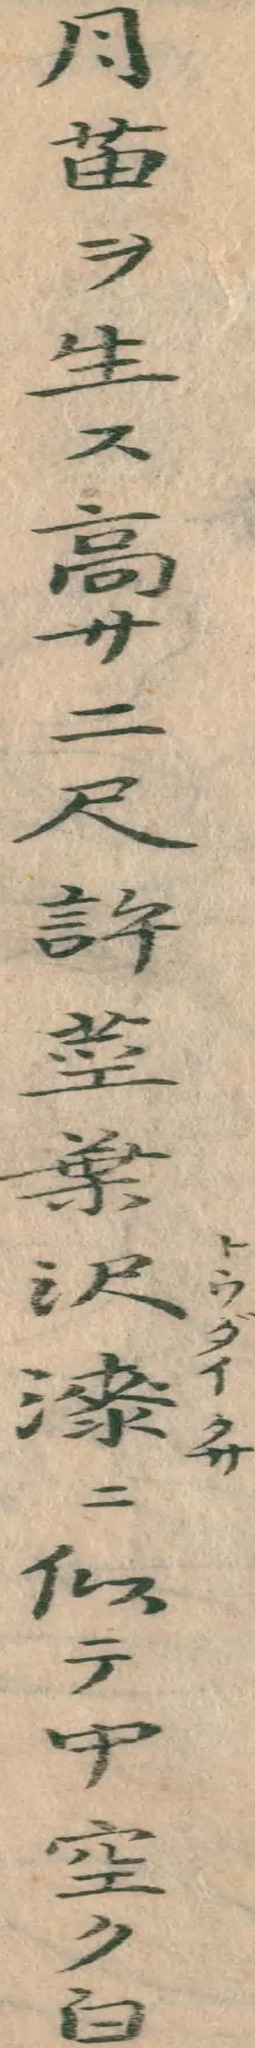月苗ヲ生ス高サ二尺許茎葉沢漆ニ似テ中空ク白
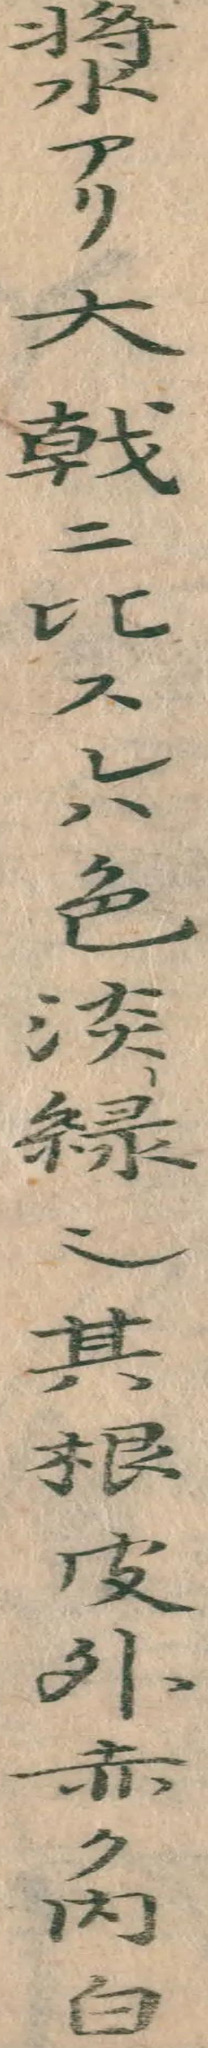漿アリ大戟ニ比スレハ色淡-緑也其根皮外赤ク内白
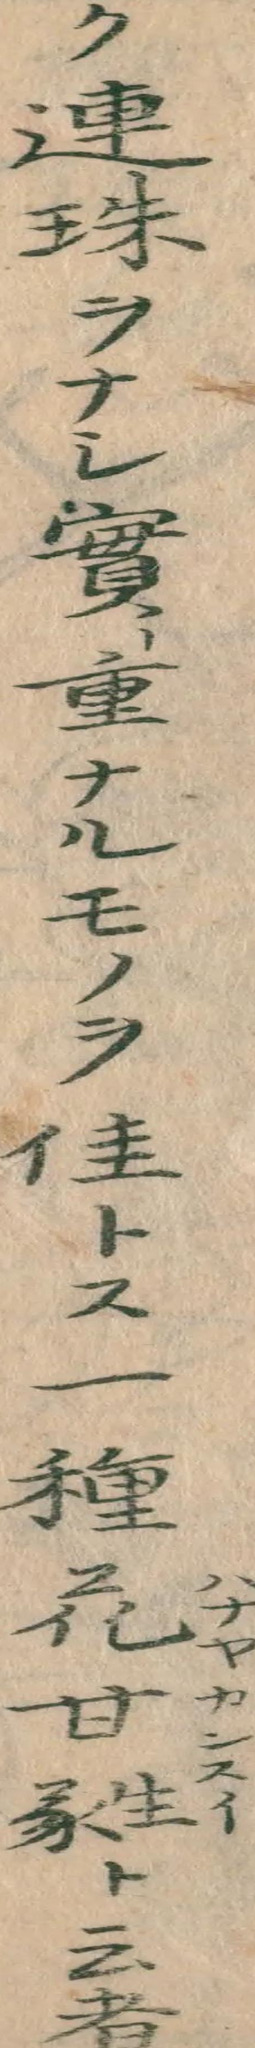ク連珠ヲナシ実-重ナルモノヲ佳トス一種花甘蕤ト云者
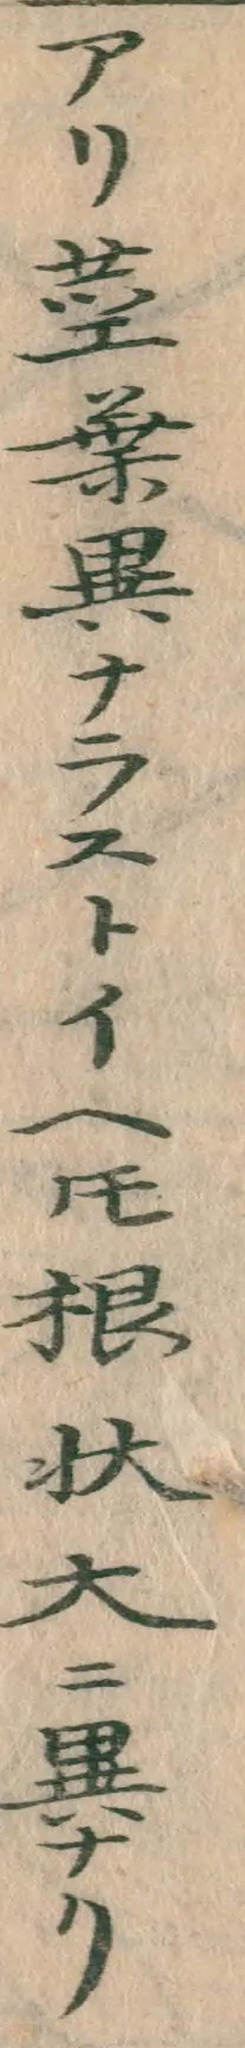アリ茎葉異ナラストイヘトモ根状大ニ異ナリ
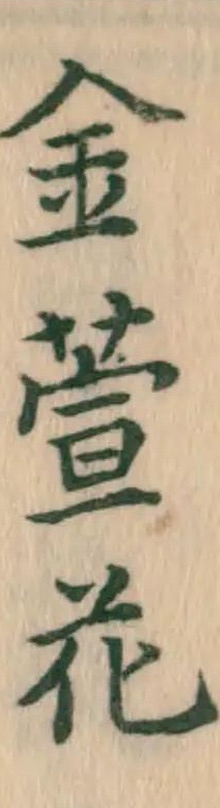金萱花

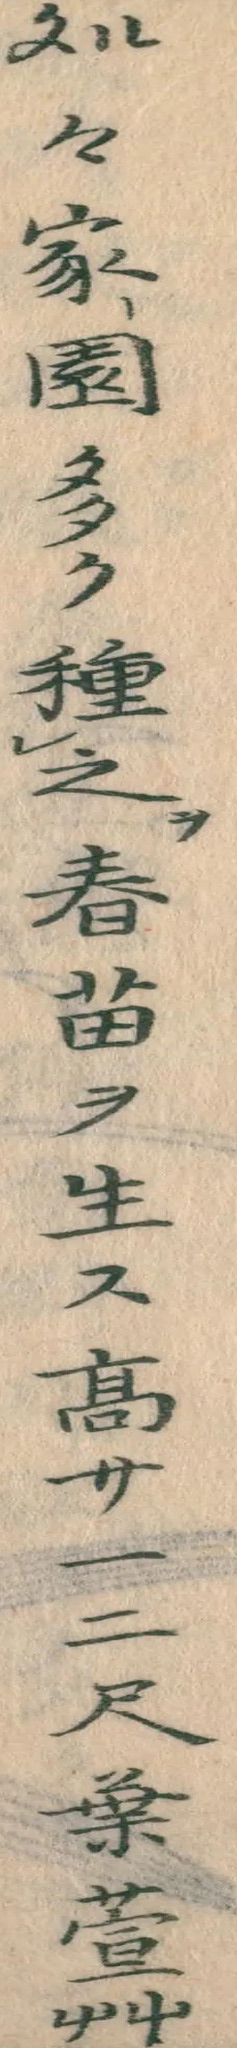処々家-園多ク種之春苗ヲ生ス高サ一二尺葉萱草
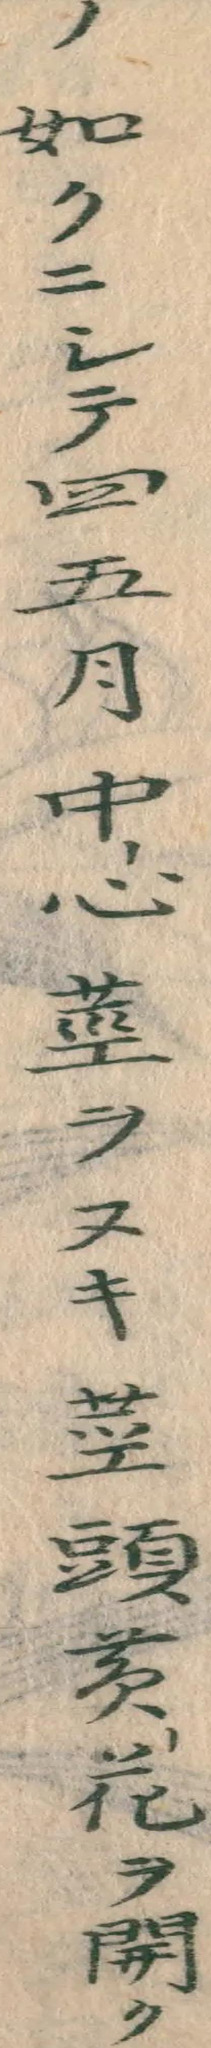ノ如クニシテ四五月中-心茎ヲヌキ茎頭黄-花ヲ開ク
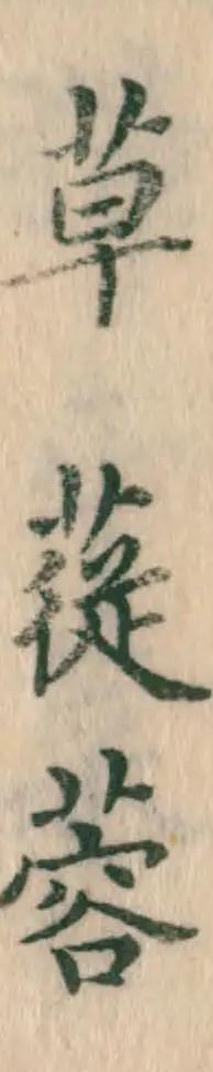草蓯蓉

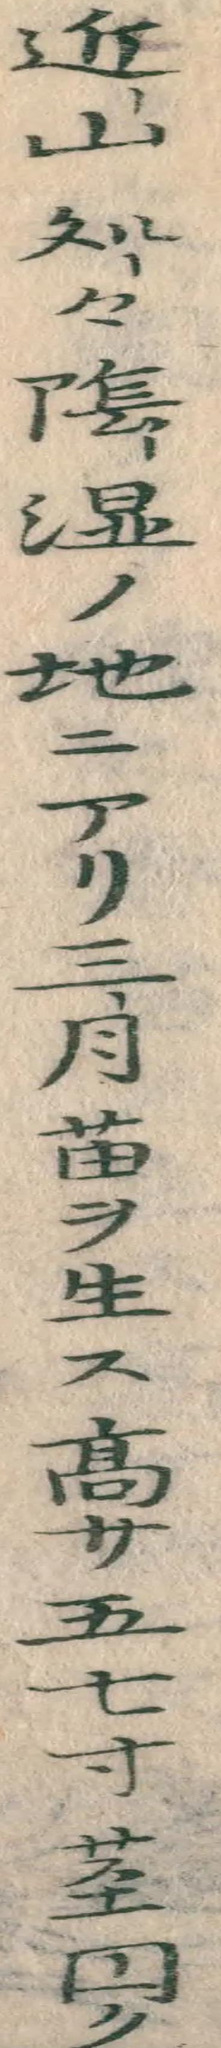近-山処-々陰-湿ノ地ニアリ三-月苗ヲ生ス高サ五七寸茎円ク
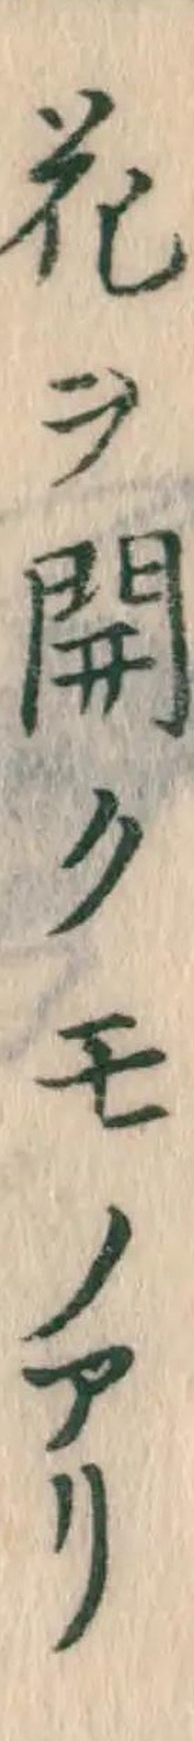花ヲ開クモノアリ
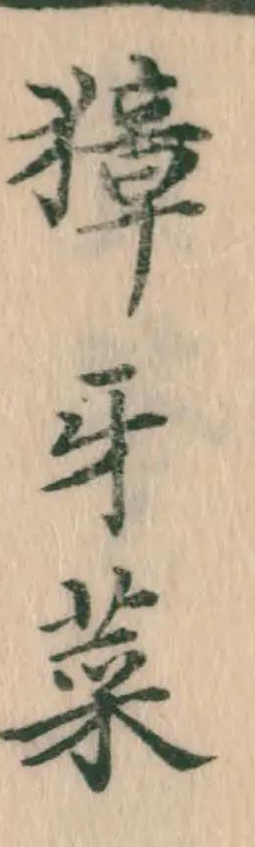獐牙菜

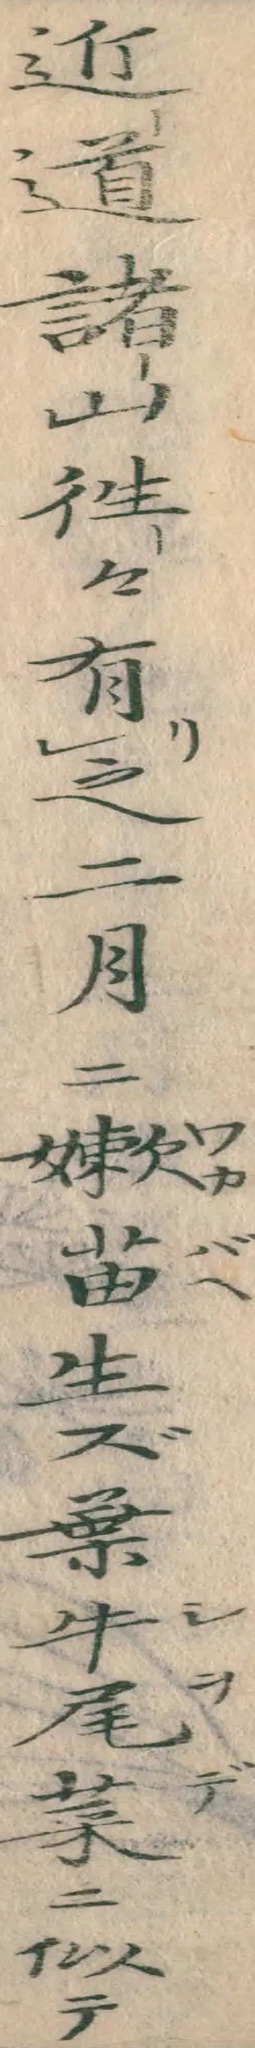近-道諸-山往-々有之二月ニ嫩苗生ズ葉牛尾菜ニ似テ
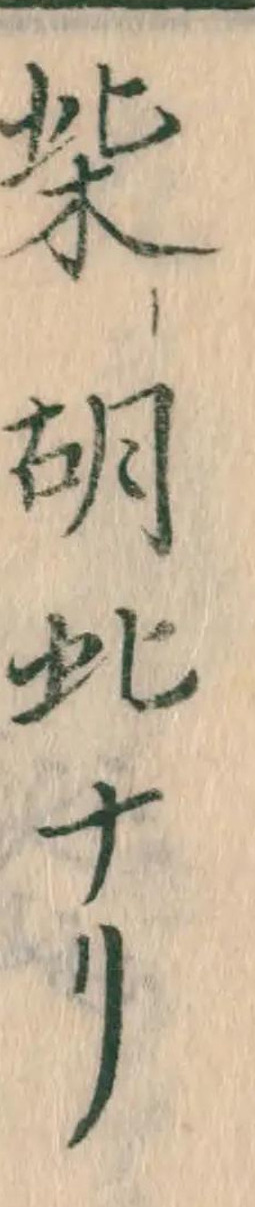柴-胡此ナリ
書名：花彙 草部4巻木部4巻. [1]
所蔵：国立国会図書館 National Diet Library, JAPAN
